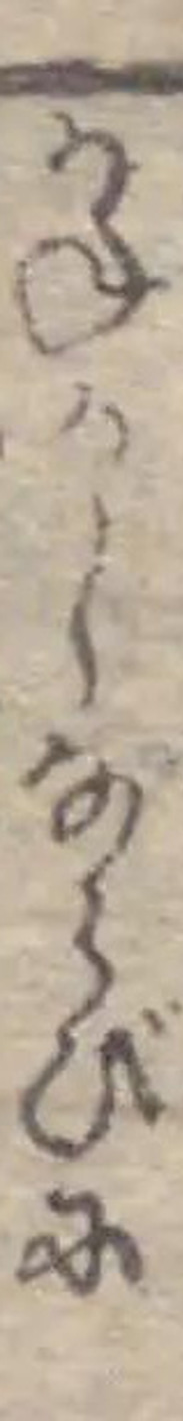かねかしならびに
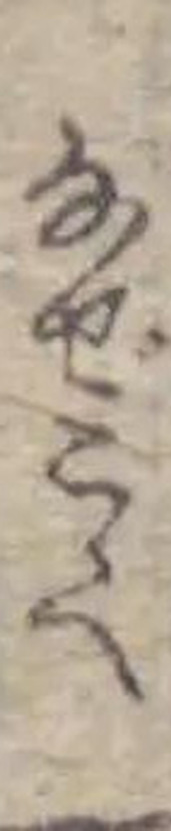なぜこゝへ
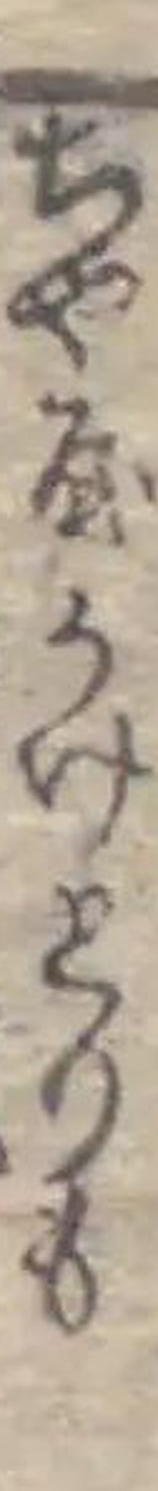ちや屋かけとりも
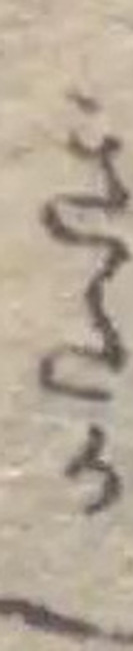きたか
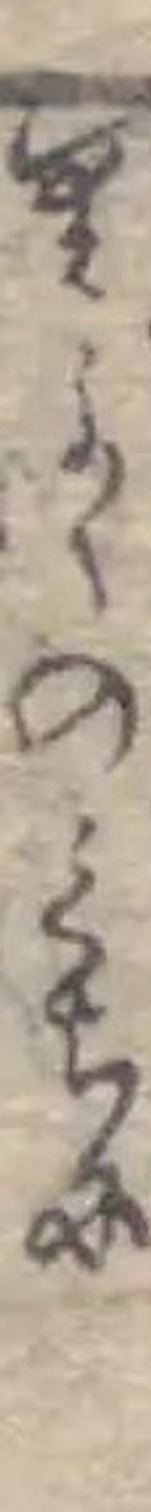りよくのみちに
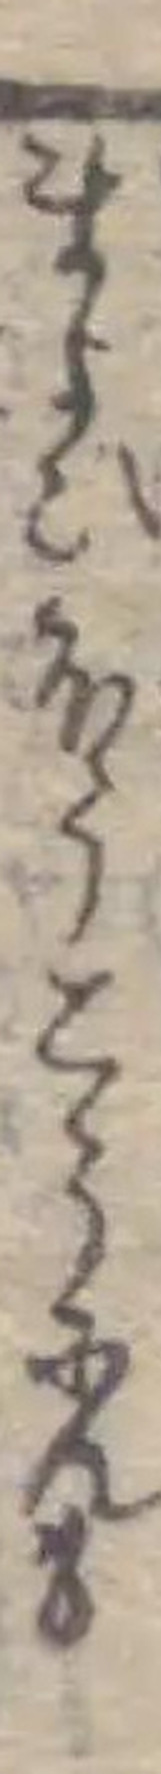まよひほうこうにんも
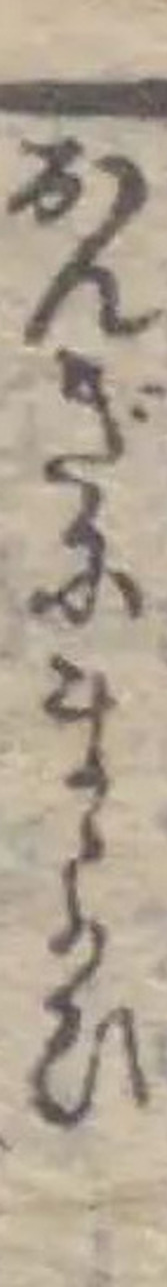おんぎにまよひ
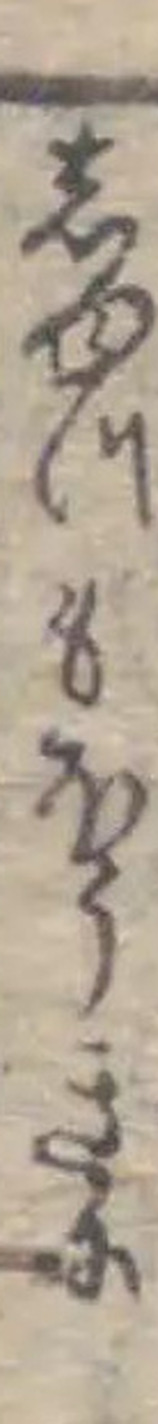しゆつもほうきに
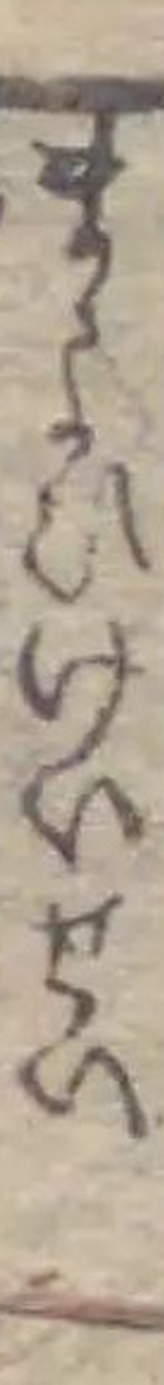まよひけいせい
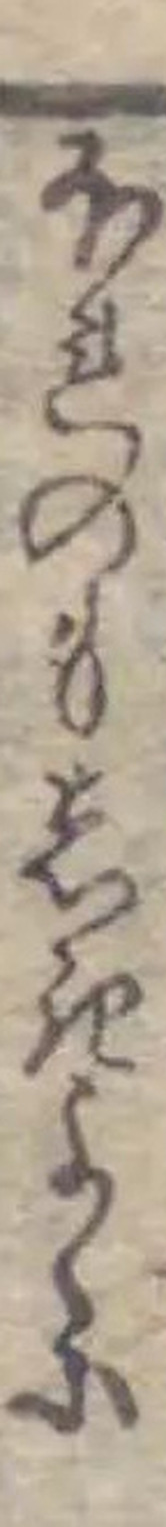ほれのもしきよくに
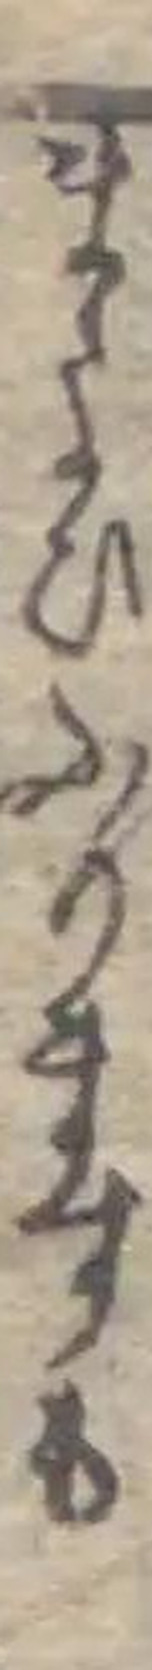まよひふりますも
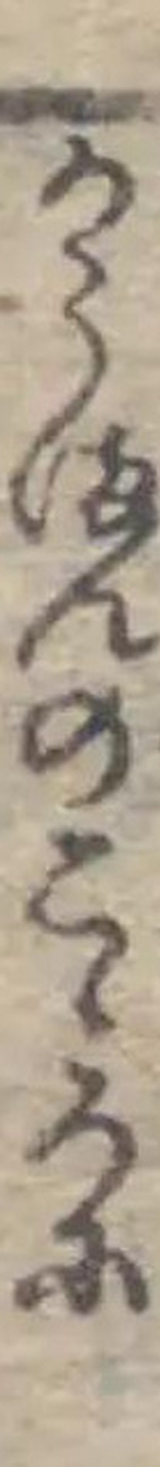かうまんのこゝろに
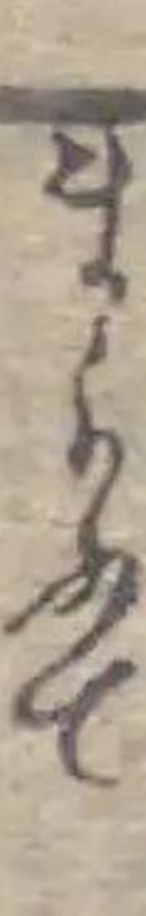まよふて
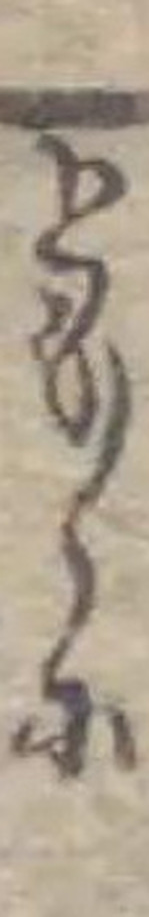とも〳〵に
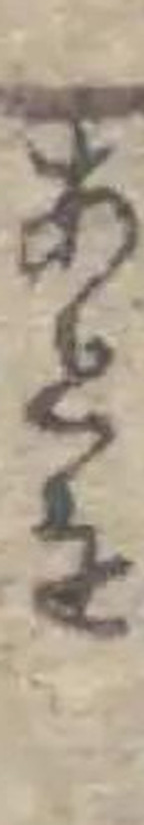あとを
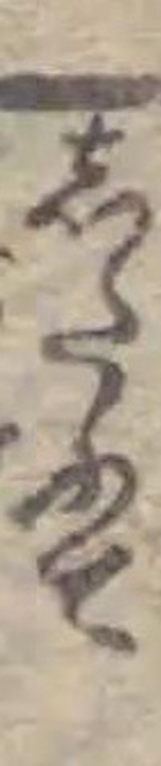したふて
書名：福壽海旡量品玉 3巻
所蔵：国立国会図書館 National Diet Library, JAPAN
